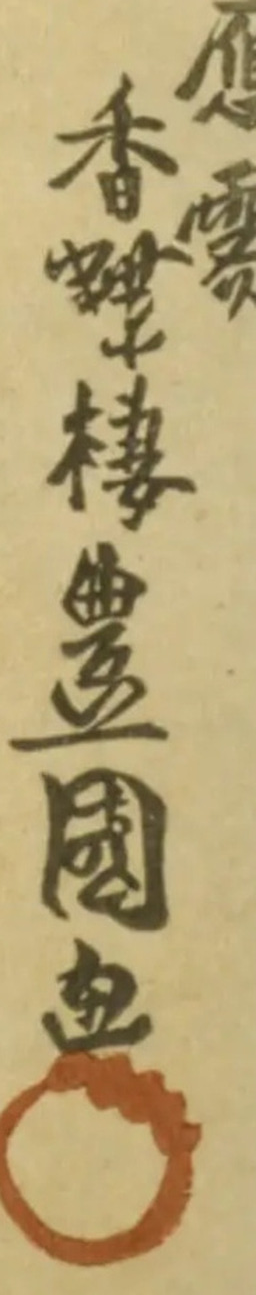香蝶棲豊国画
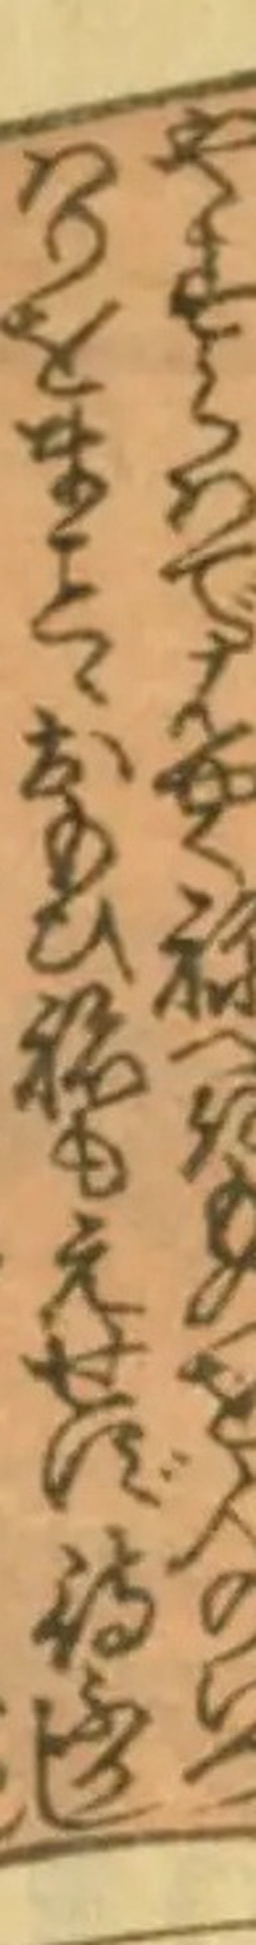はりをまことゝおもひねもえせず待ふかし
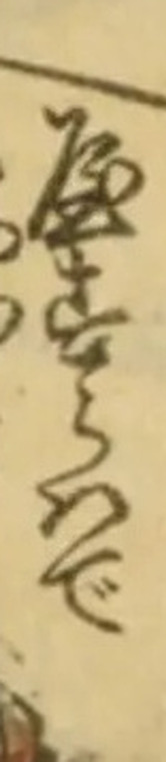やすらはで
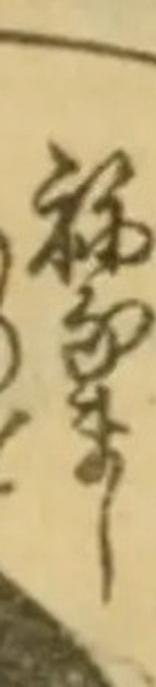ねなまし
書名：五十九番　赤染衛門
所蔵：国立国会図書館 National Diet Library, JAPAN
